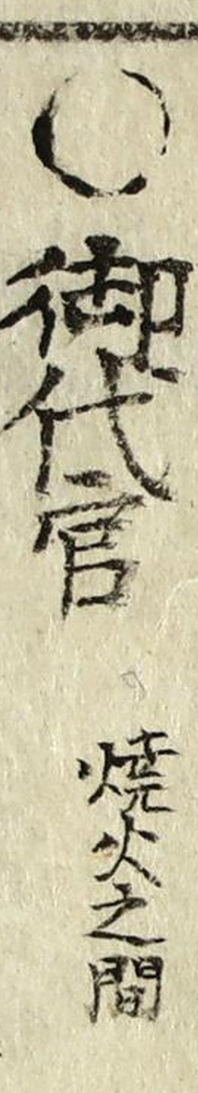○御代官焼火之間
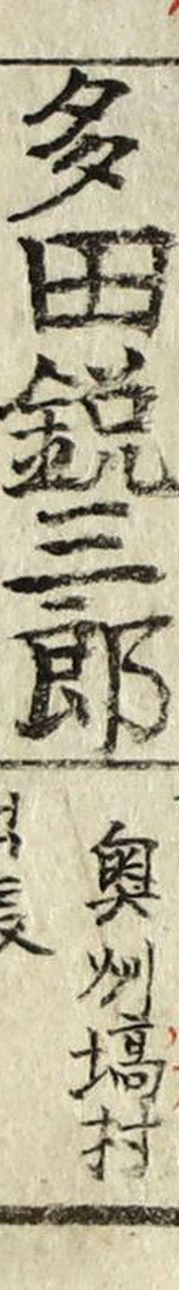多田鋭三郎奥州塙村
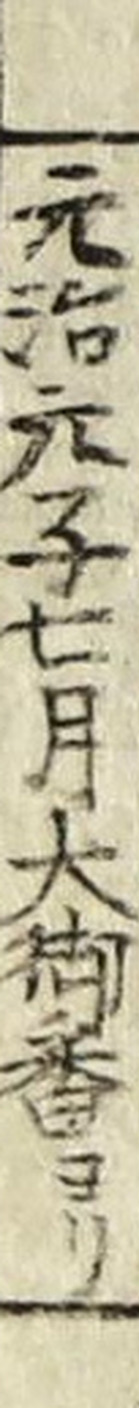元治元子七月大御番ヨリ
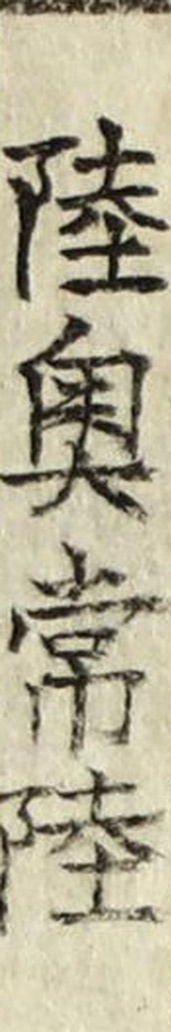陸奥常陸
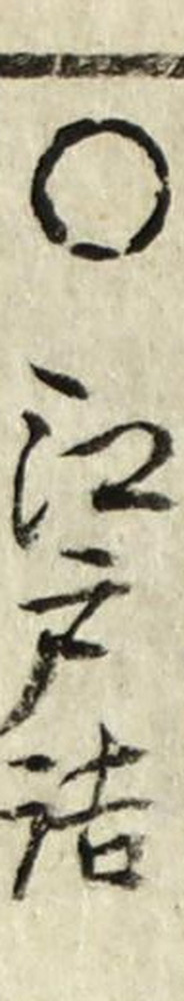○江戸詰
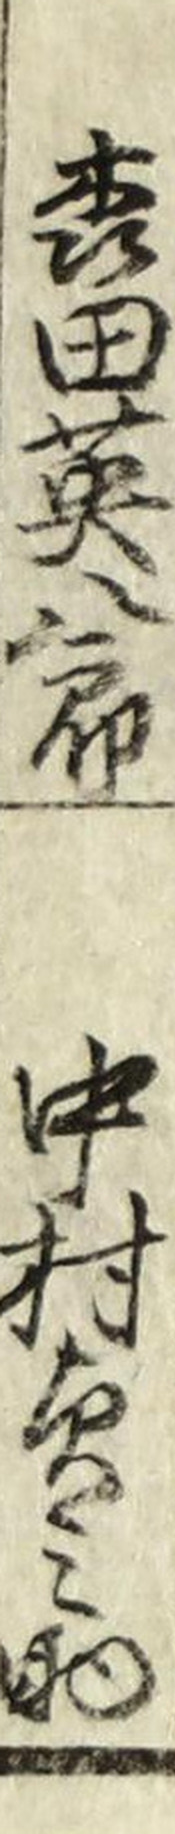森田英八郎中村貞之助
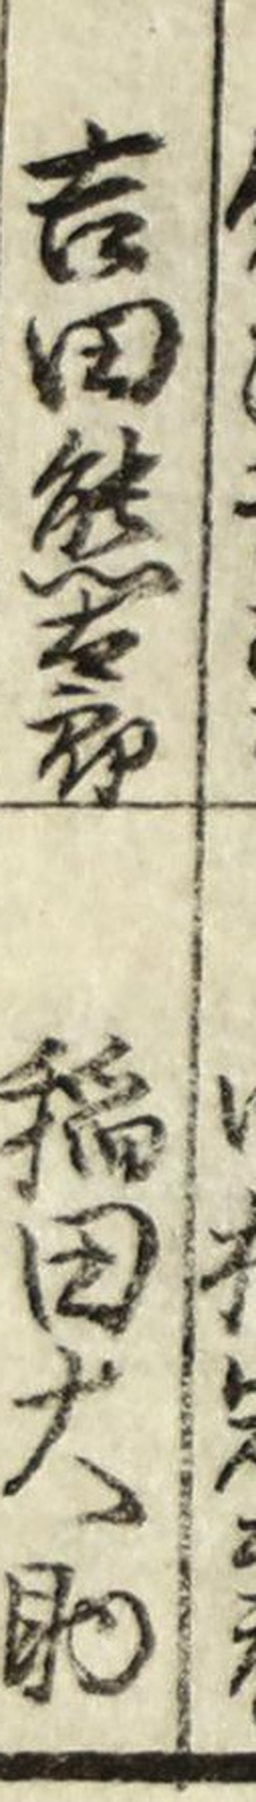吉田熊太郎稲田大助

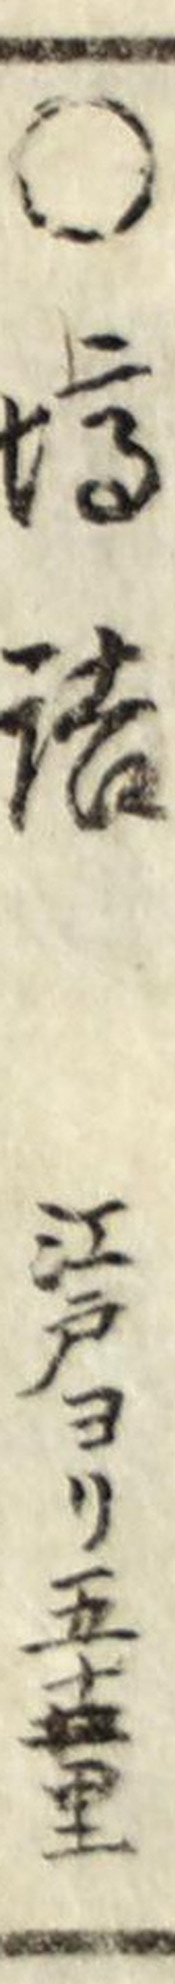○浅川詰江戸ヨリ五十五里
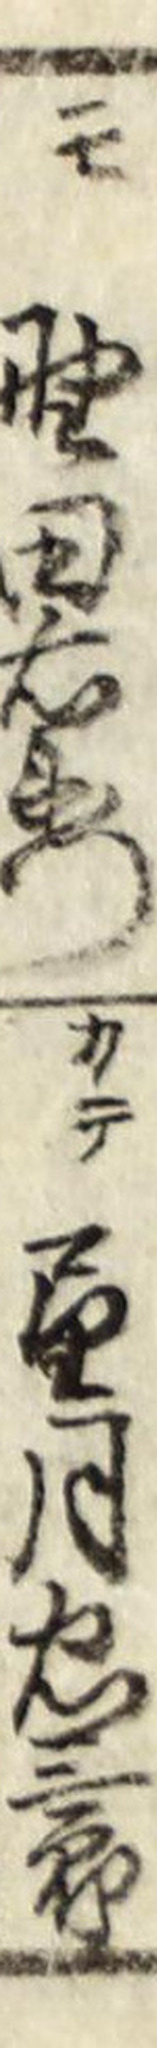モ野田右衛門カテ望月忠三郎
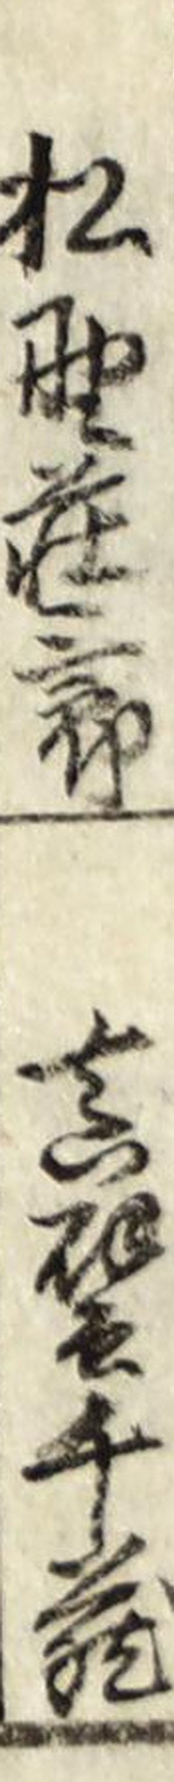松野荘三郎真壁千蔵
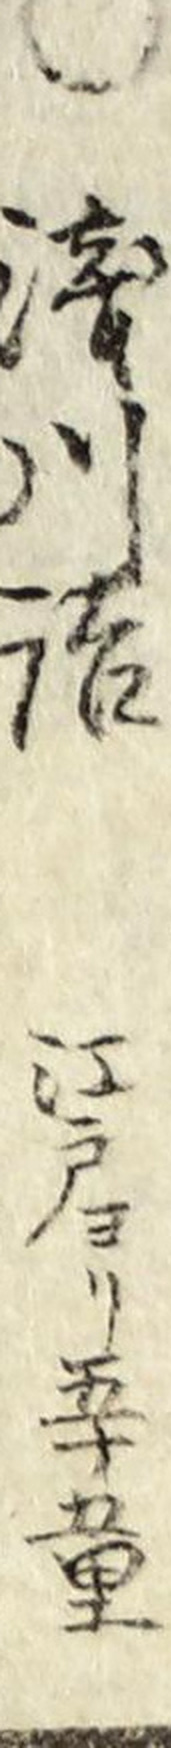○浅川詰江戸ヨリ五十五里
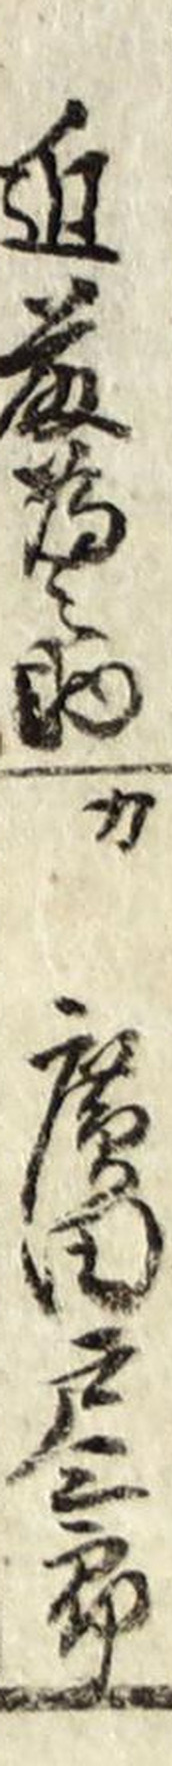近藤為之助カ廣田戸三郎
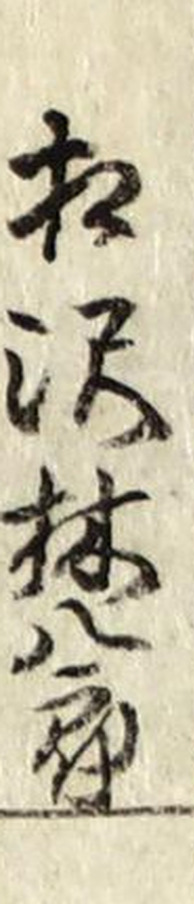相沢林八郎
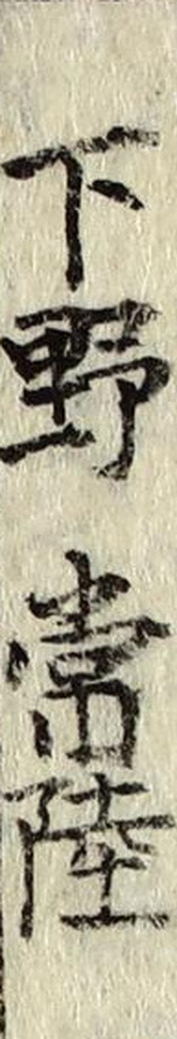下野常陸
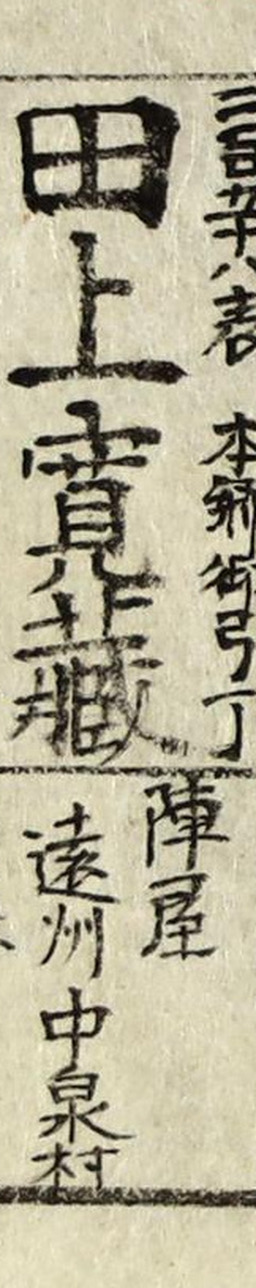田上寛蔵遠州中泉村
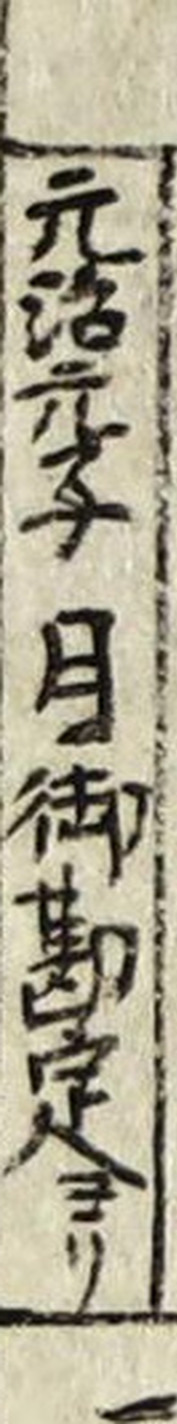元治元子月御勘定ヨリ
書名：（全国郡代・代官所諸役人名列）
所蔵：福井県文書館 Fukui Prefectural Archives
